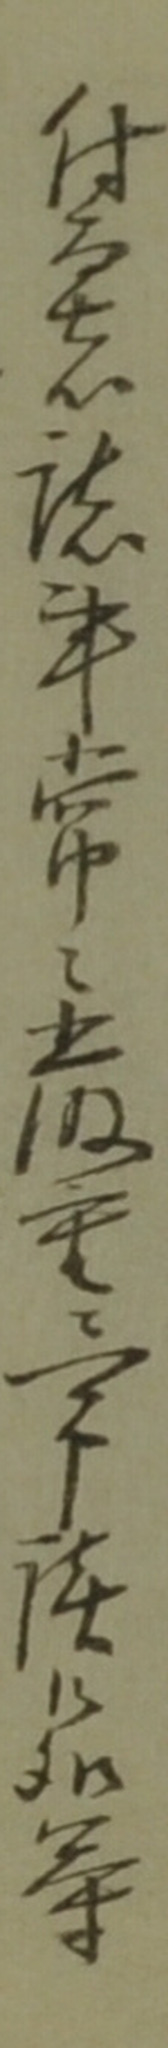付而者諸事常々厳重ニ可申談候処等
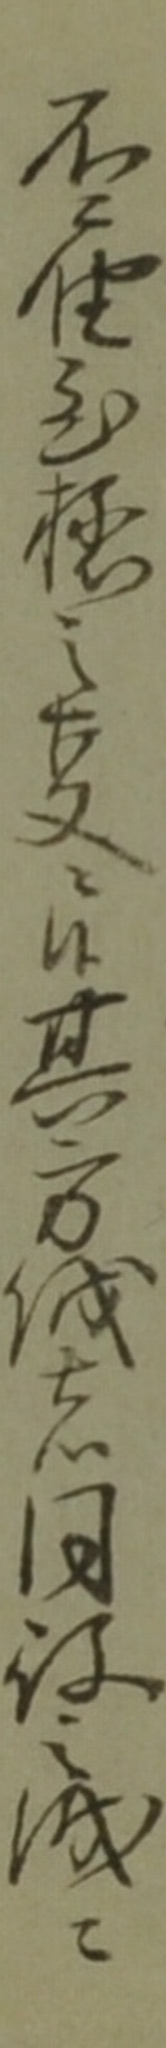不届至極之事ニ候其方儀者同役之儀ニ
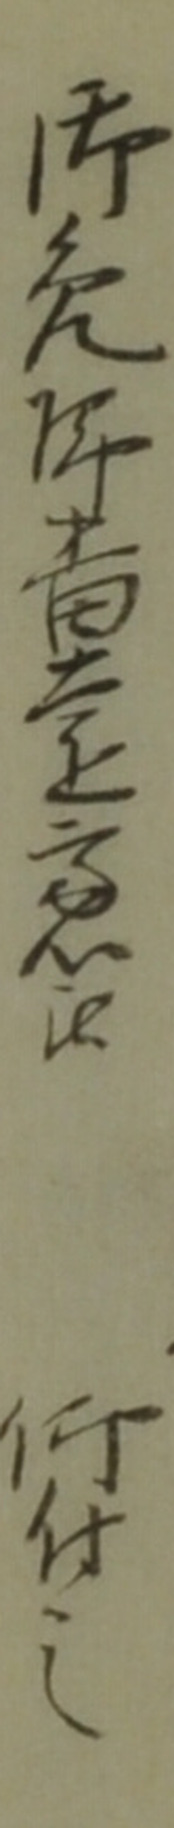御免帰番遠慮被仰付之
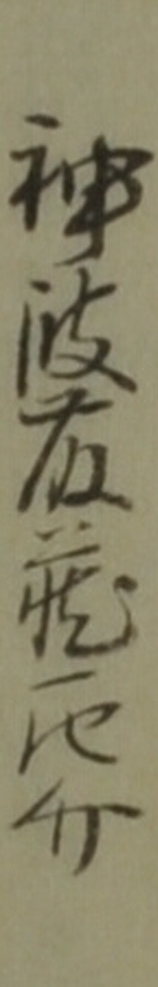神波藤蔵厄介
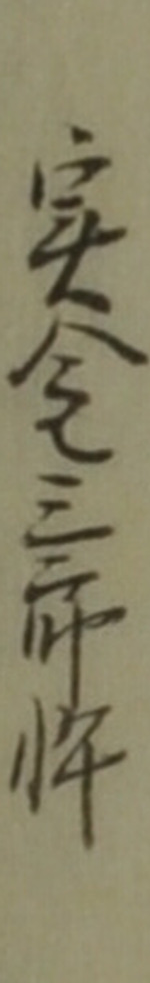実金三郎忰
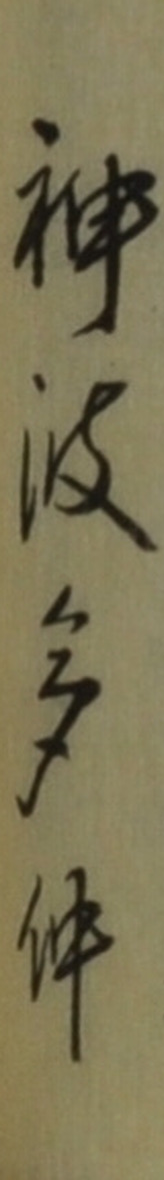神波多仲
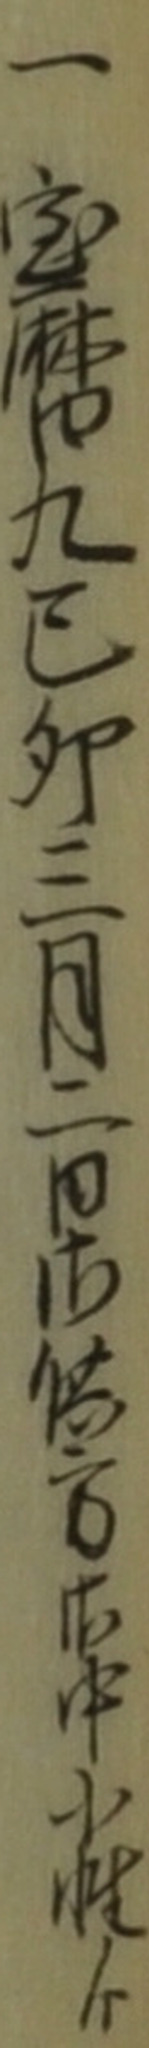一宝暦九宇三月二日御供方御中小性ゟ
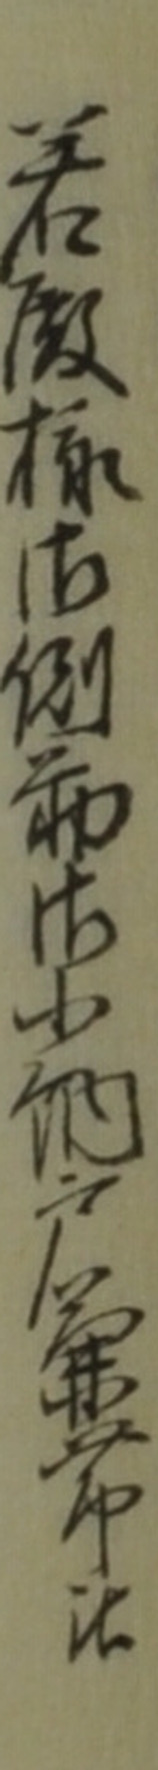若殿様御側勤御小納戸兼帯被
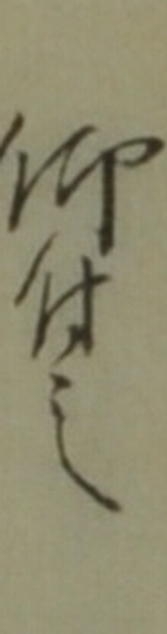仰付之
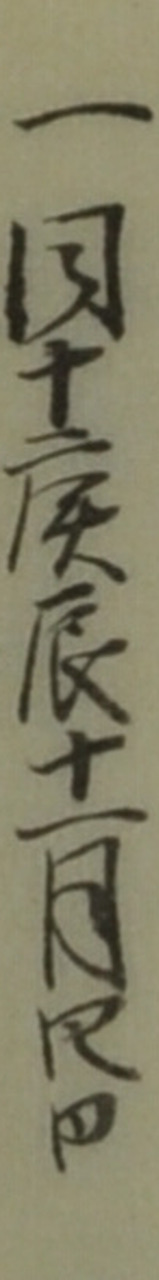一同十庚辰十一月四日
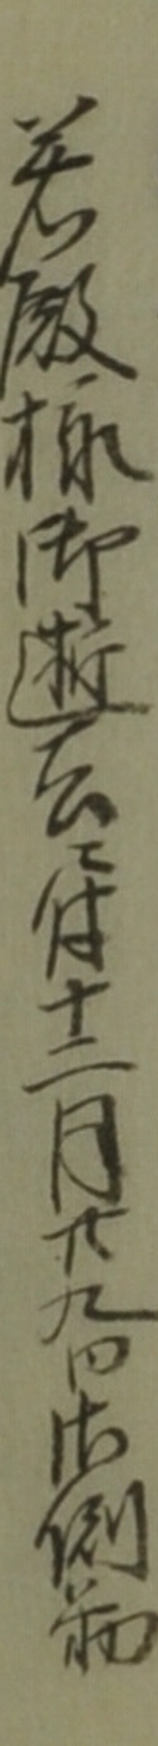若殿様御逝去ニ付十二月廿九日御側勤
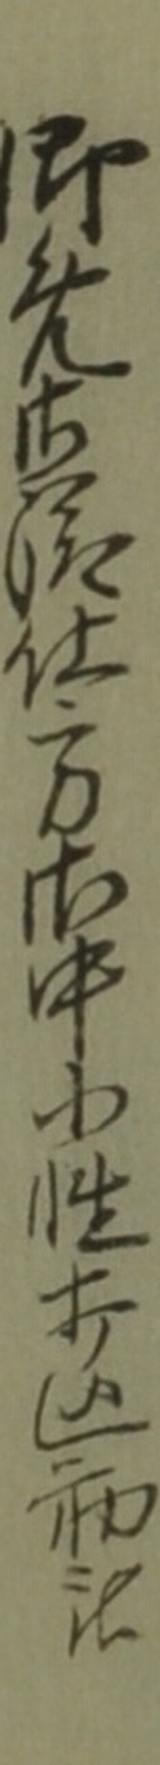御先御給仕方御中小性打込勤被
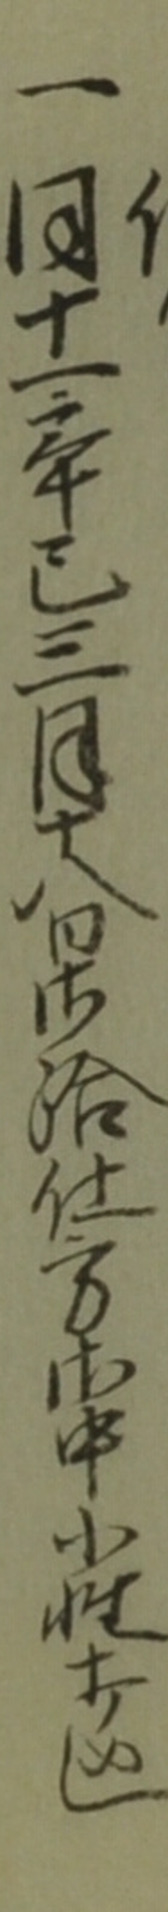一同十一月辛三月十八日御給仕方御中小性打込
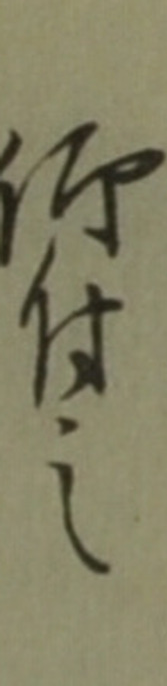仰付之
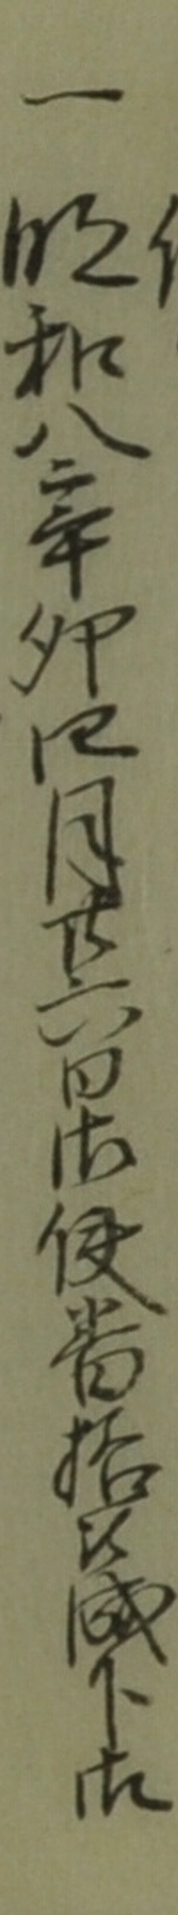一明和八辛卯四月廿六日御使番格被成下御
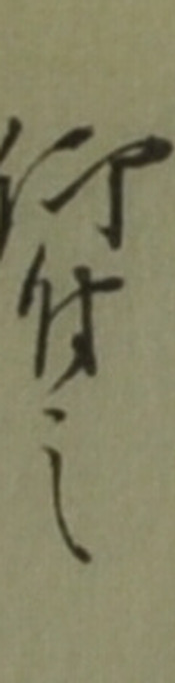仰付之
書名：諸御役代々録（四）
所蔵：伊那市立高遠町図書館・合同会社AMANE
